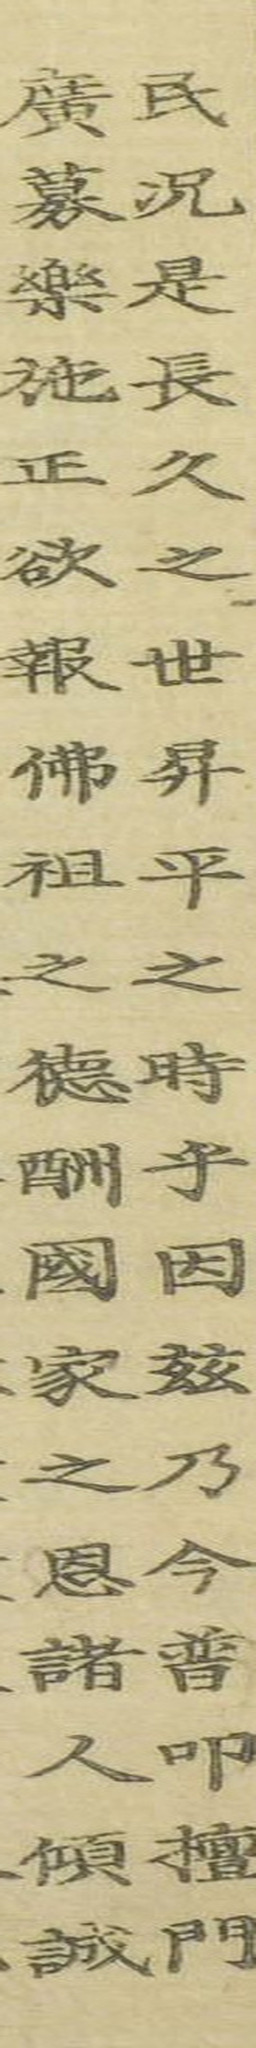廣募樂施正欲報佛祖之德酬國家之恩諸人傾誠
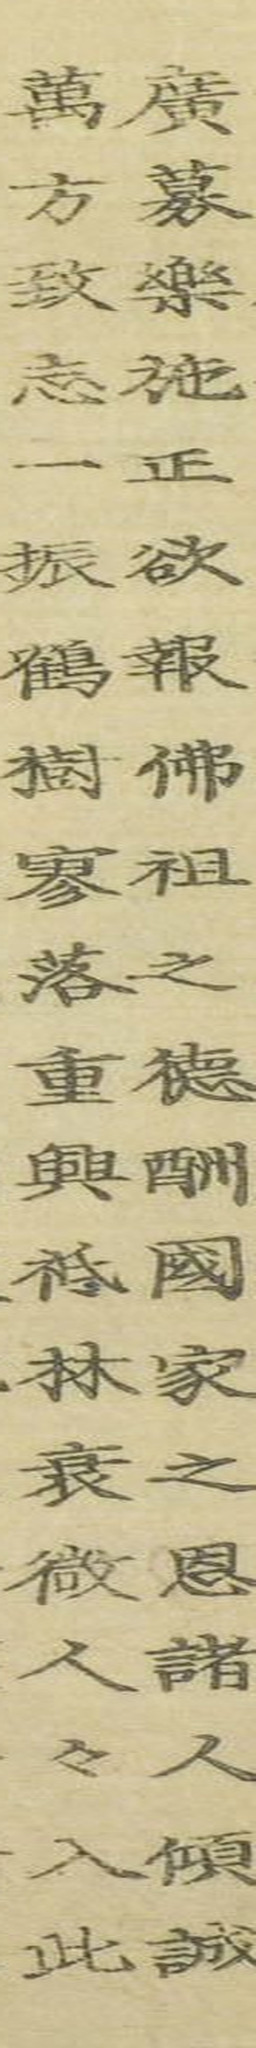萬方致志一振鶴樹寥落重興祗林衰微人々入此
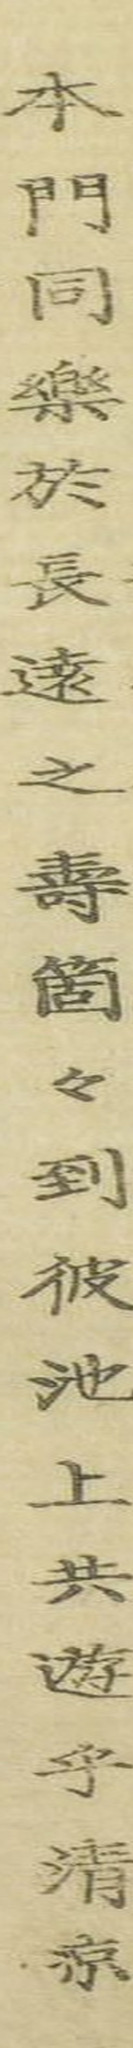本門同樂於長遠之壽箇々到彼池上共遊乎清凉
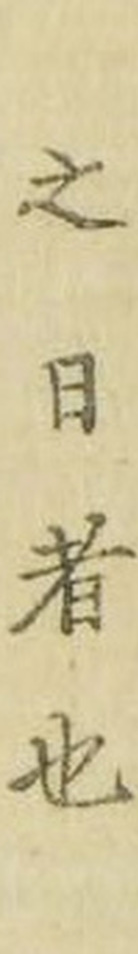之日者也
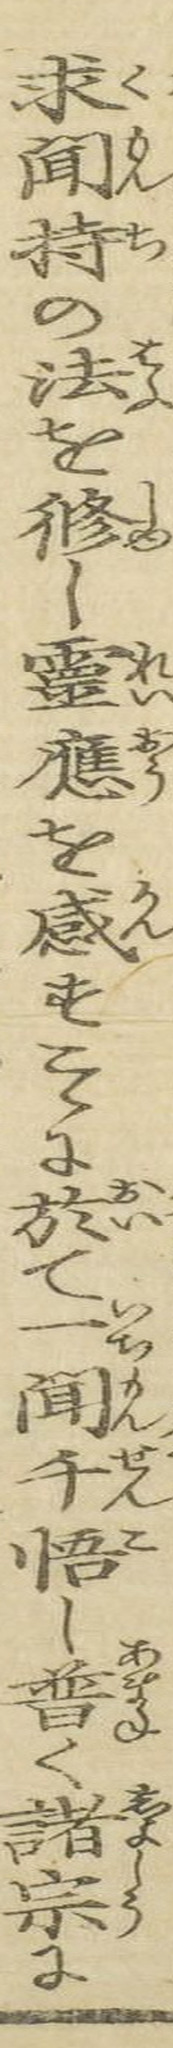求聞持の法を修し靈應を感すこゝに於て一聞千悟し普く諸宗に
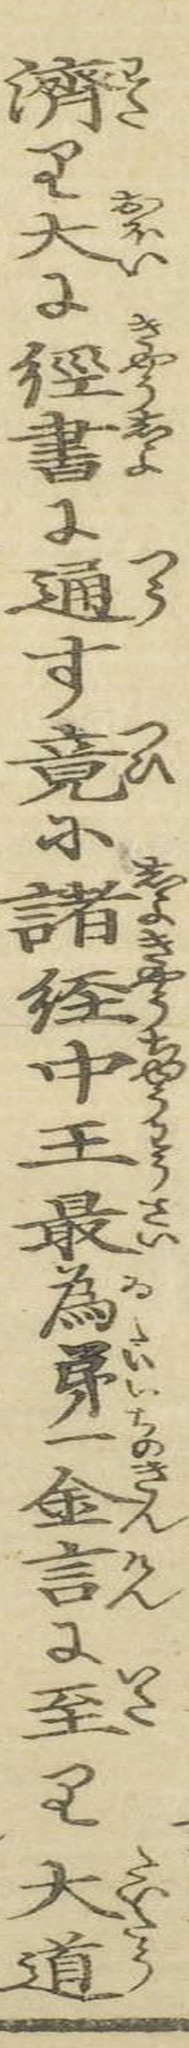濟り大に經書に通す竟に諸経中王最為第一金言に至り大道
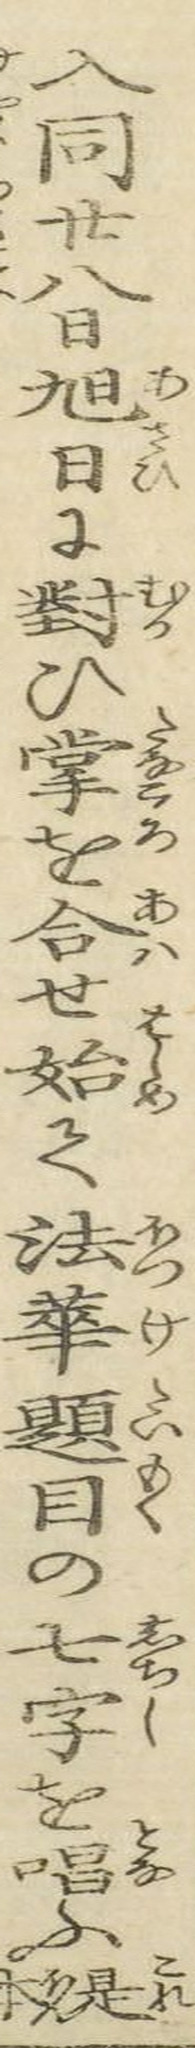入同廿八日旭日に對ひ掌を合せ始て法華題目の七字を唱ふ是本
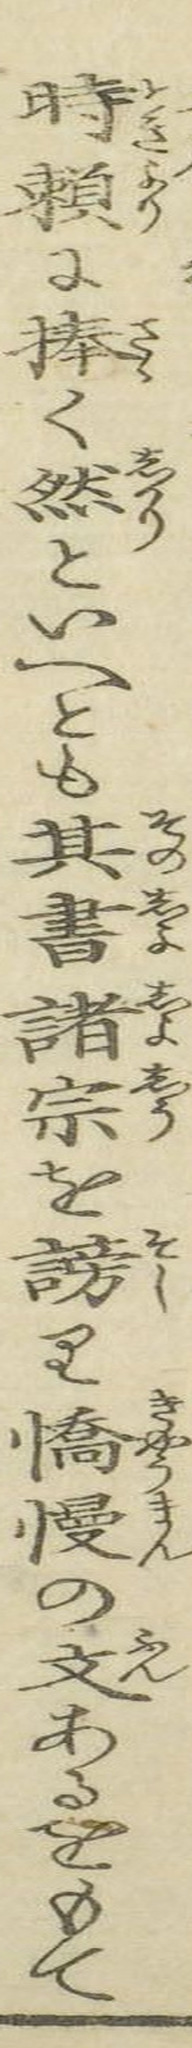時頼に捧く然といへとも其書諸宗を謗り憍慢の文あるをもて
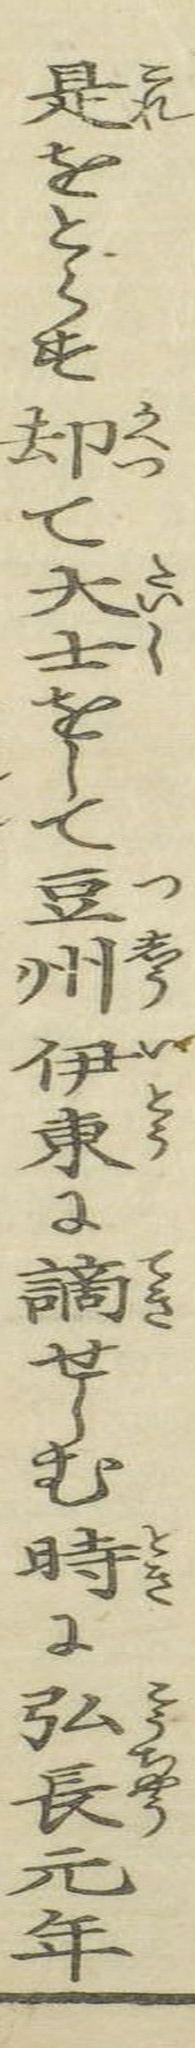是をとらす却て大士をして豆州伊東に謫せしむ時に弘長元年

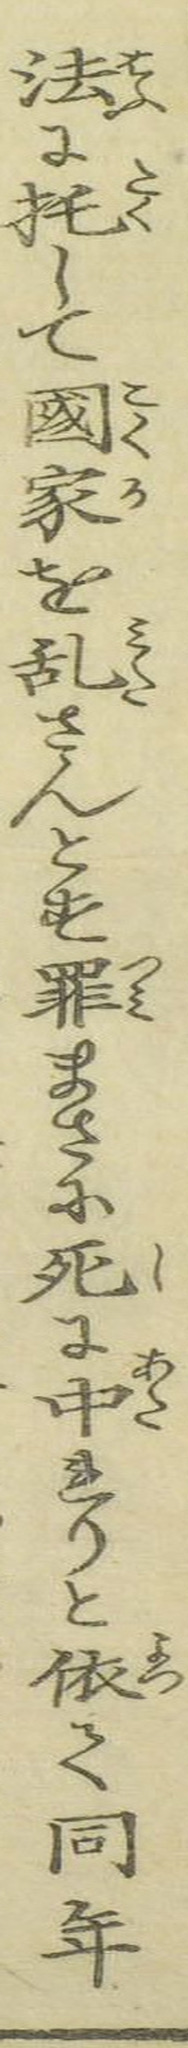法に托して國家を乱さんとす罪まさに死に中れりと依て同年
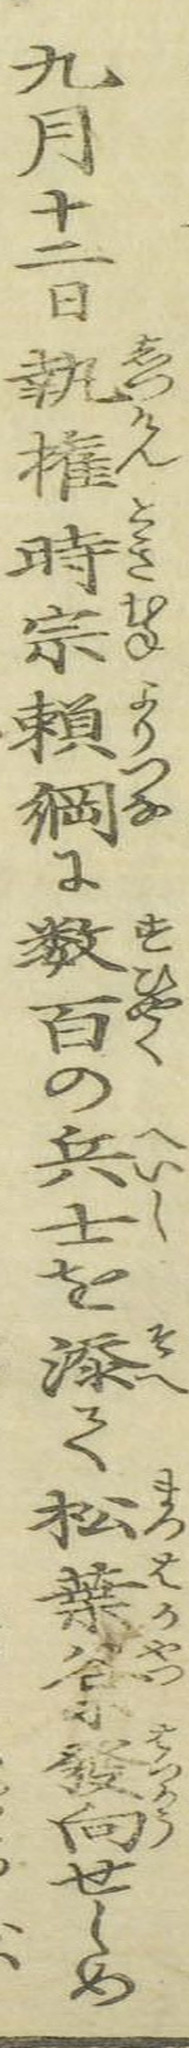九月十二日執権時宗頼綱に数百の兵士を添て松葉谷に發向せしめ
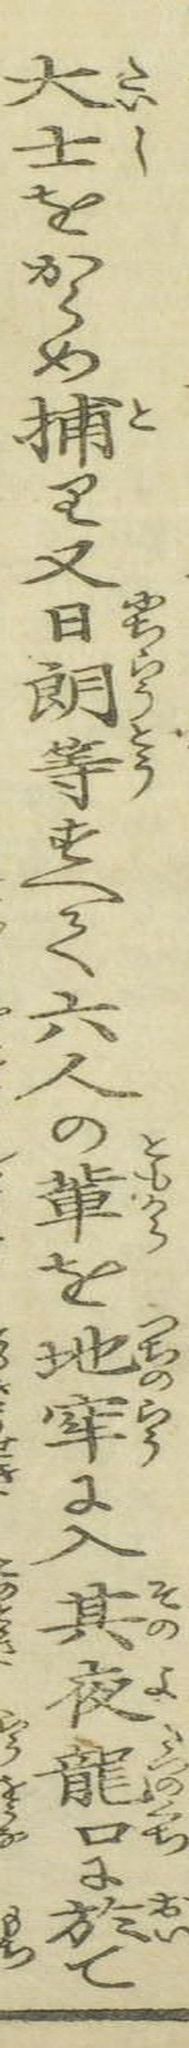大士をからめ捕り又日朗等すへて六人の軰を地窂に入其夜龍口に於て
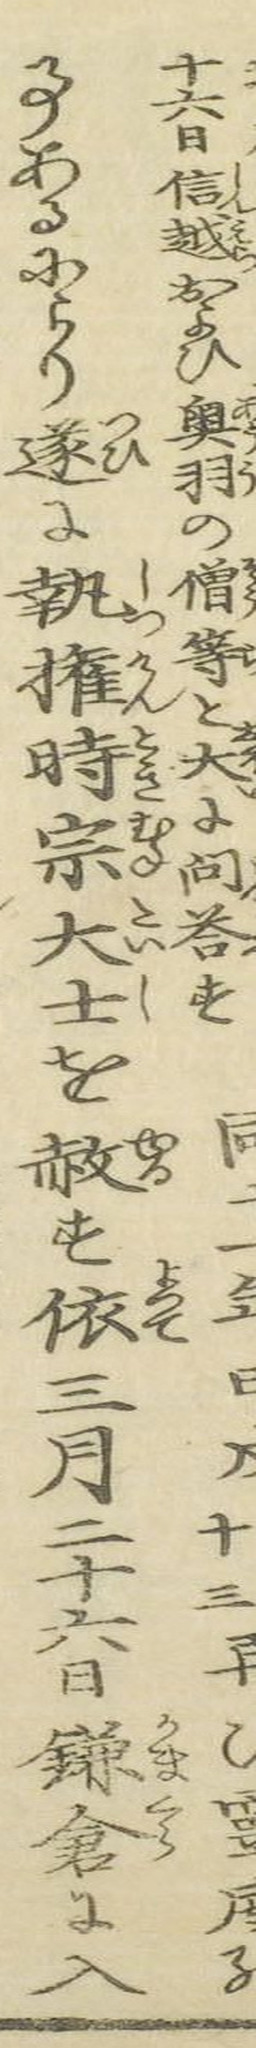事あるにより遂に執権時宗大士を赦す依三月二十六日鎌倉に入
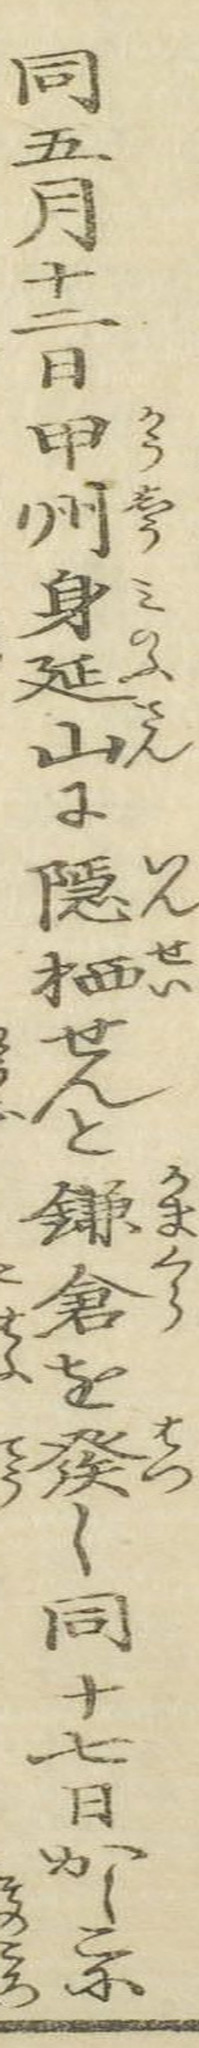同五月十二日甲州身延山に隱栖せんと鎌倉を發し同十七日かしこに
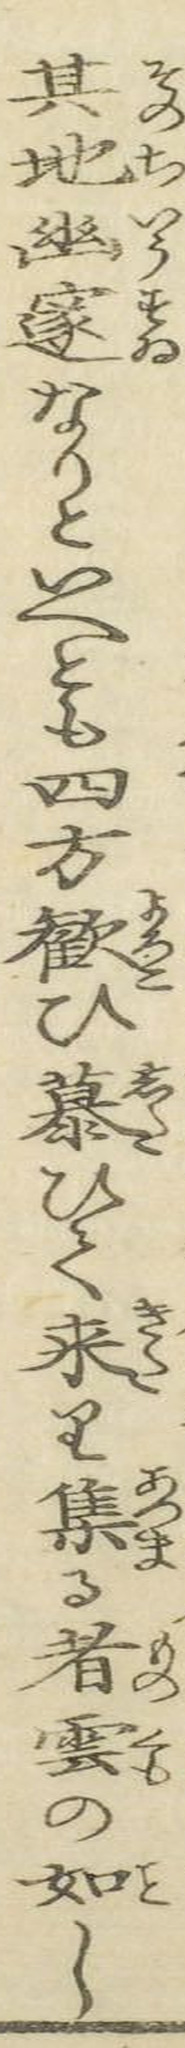其地幽邃なりといへとも四方歓ひ慕ひて来り集る者雲の如し
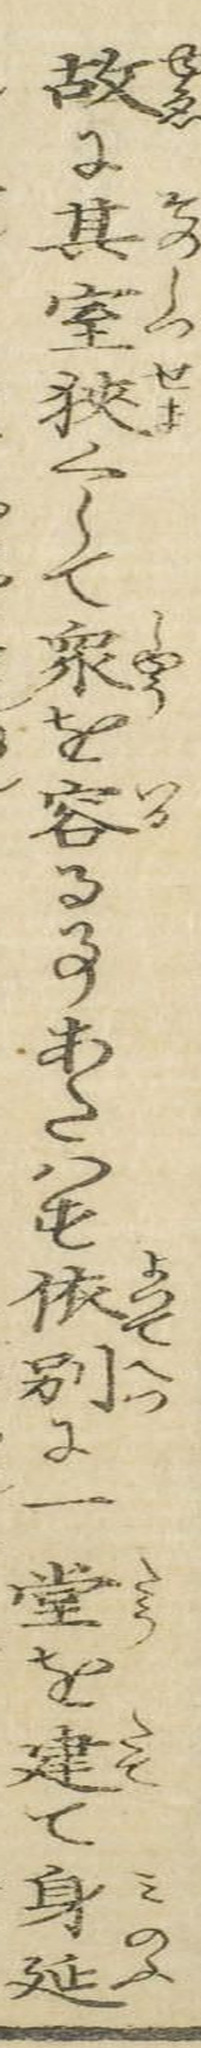故に其室狹くして衆を容る事あたはす依別に一堂を建て身延
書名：江戸名所図会 20巻 巻之4
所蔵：東京学芸大学教育コンテンツアーカイブ
